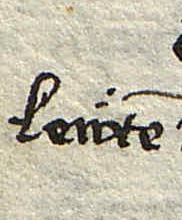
leẅte*
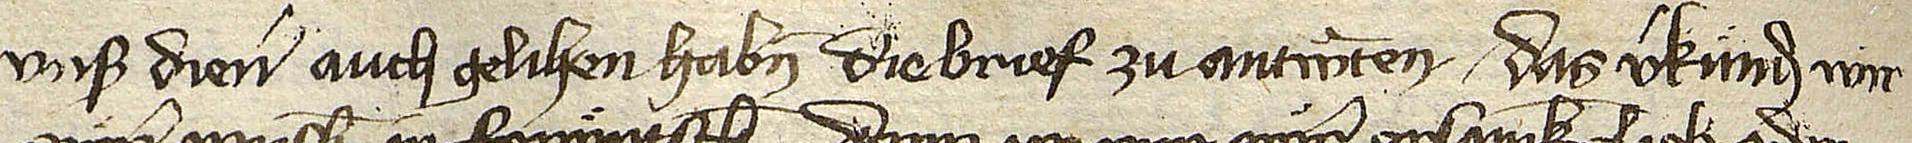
vnſ* dien* auch gelihen habn* die brief ʒu antwt*en / das v*künd* wir
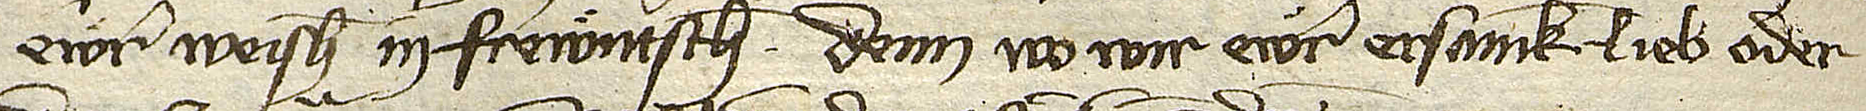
eẅr* weiſh* in freẅntſch* . Denn wo wir eẅr* erſamk* lieb oder
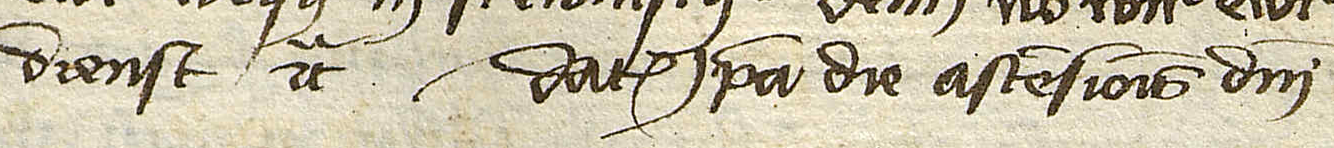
dienſt ec* / Dat* Ipa* die aſce*ſiois* dni*
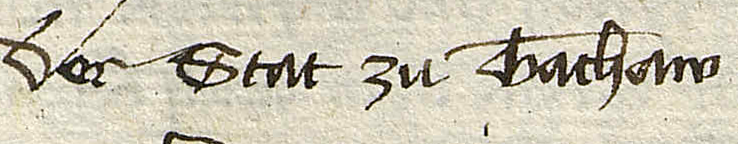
Der Stat ʒu Tachaw
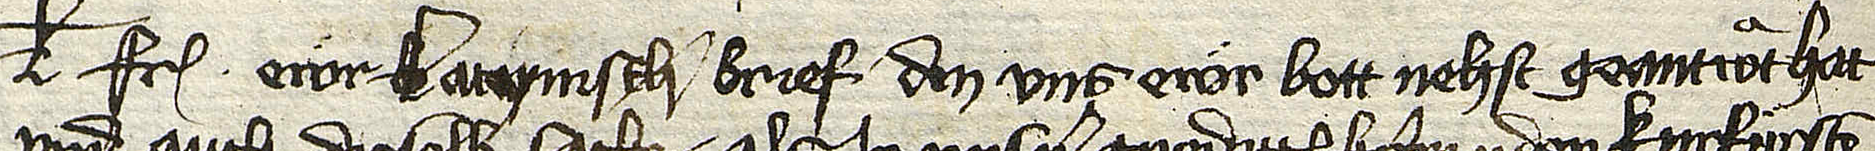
L* fr* eẅr lateyniſch* brief / den vns eẅr bott nehſt geantwt* hat
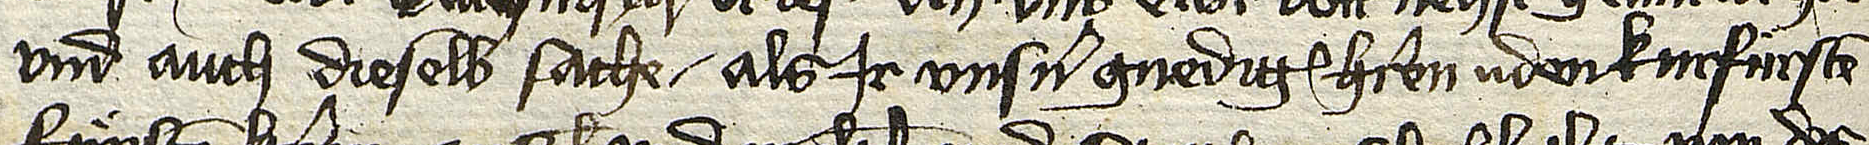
vnd auch dieſelb ſache / als Ir vnſn* gnedig* hr*en ~ den kurfürſt*
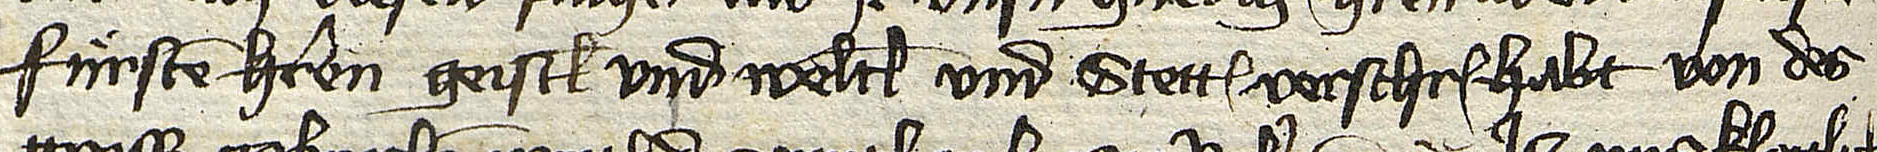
fürſte* hr*en geiſtl* vnd weltl* vnd Stett* verſchr* habt von des
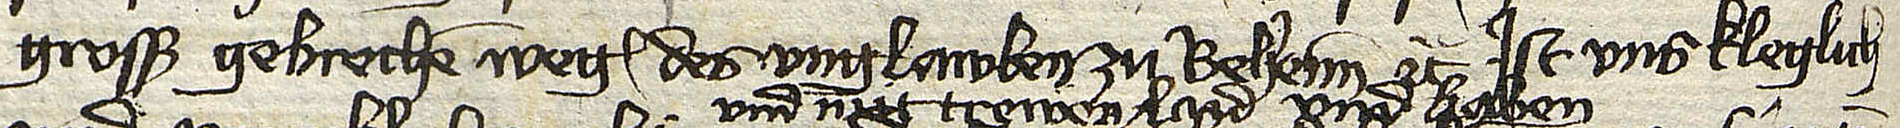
groſſ* gebreche* weg* des vnglawben ʒu Beheim ec* Iſt vns kleglich
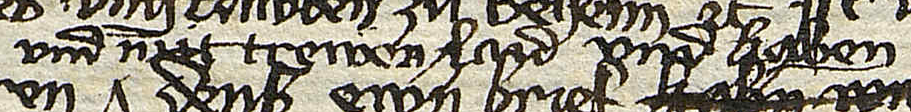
vnd mit treẅen laid vnd haben
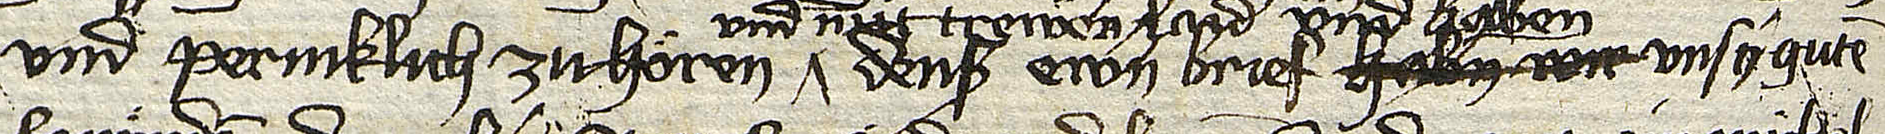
vnd permklich ʒu hören denſ* ewn* brief habn* wir vnſn* gute*
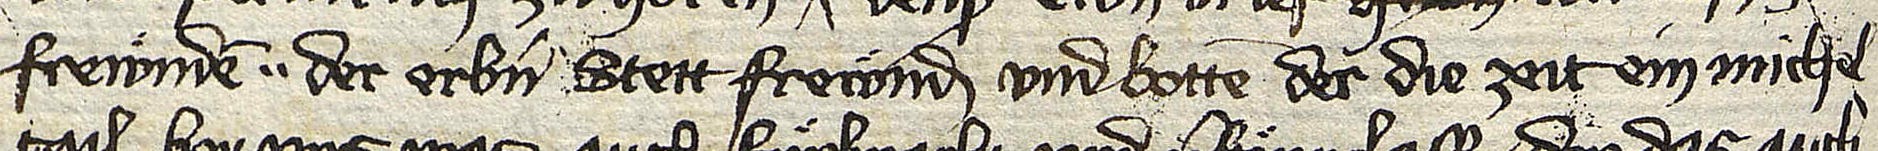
freẅnde* ~ der erbn* Stett freẅnd* vnd botte* der die ʒeit ein michel
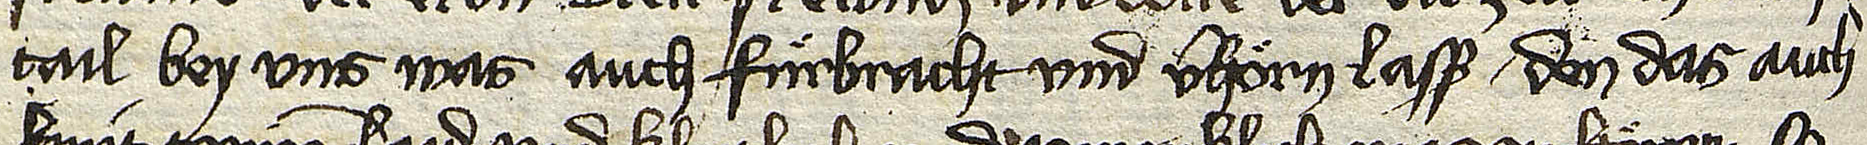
tail bey vns was auch fürbracht vnd v*hörn laſſ* / den das auch
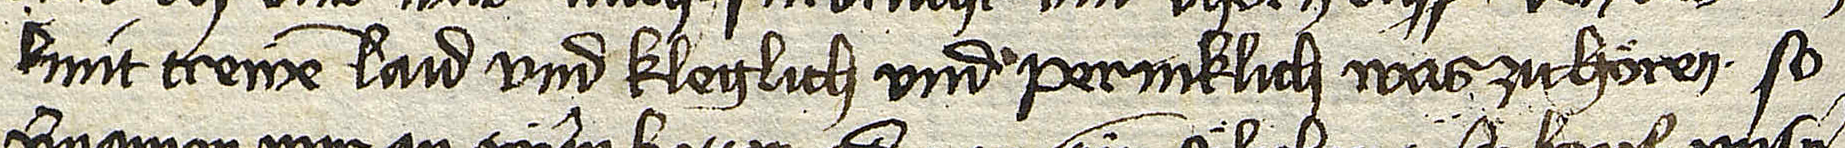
l mit treẅe* laid vnd kleglich vnd permklich was ʒu hören . ſo
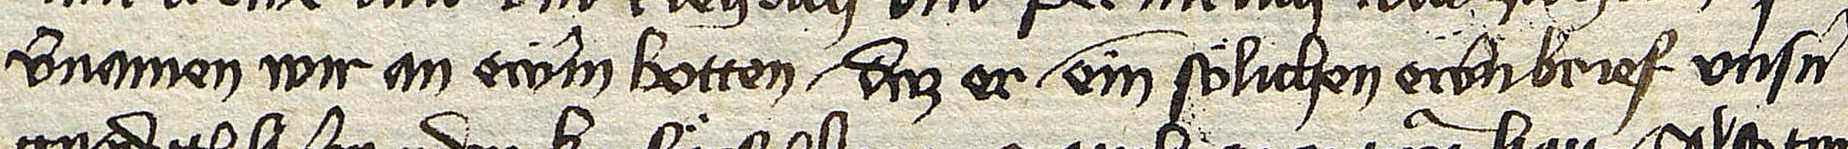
v*namen wir an ew*m botten / daʒ er ein* ſölichen eẅn* brief vnſn*
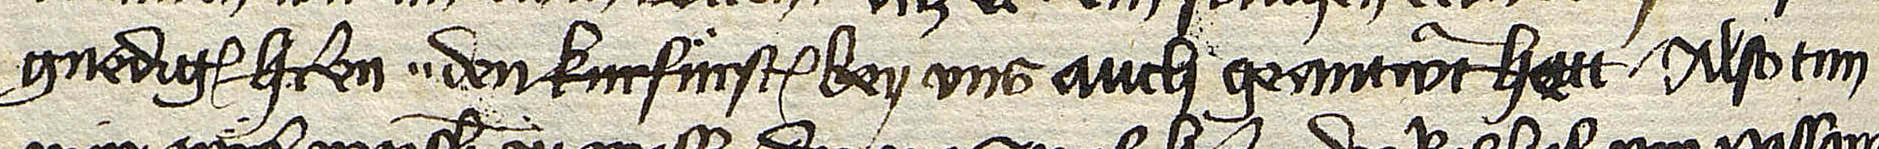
gnedig* hr*en ~ den kurfürſt* bey vns auch geantwt* hett / Alſo tun
